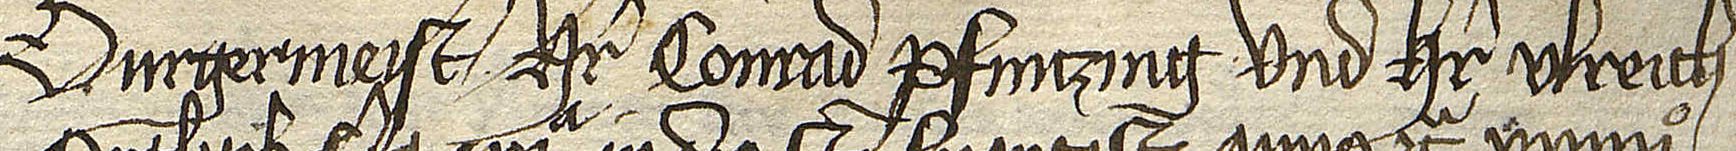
Burgermeiſt* Hr* Conrad Pfincʒing Vnd Hr* vlreich
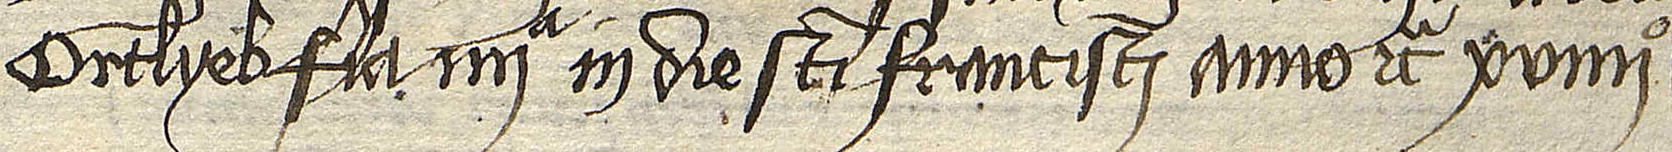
Ortlyeb fi*a iiii* in die ſci* franciſci anno ec* xviiii*
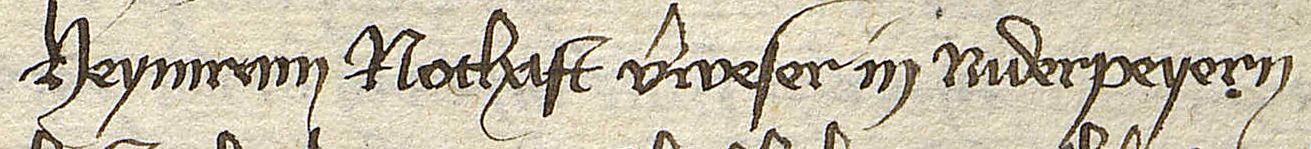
Heymram Nothaft v*weſer in Niderpeyern
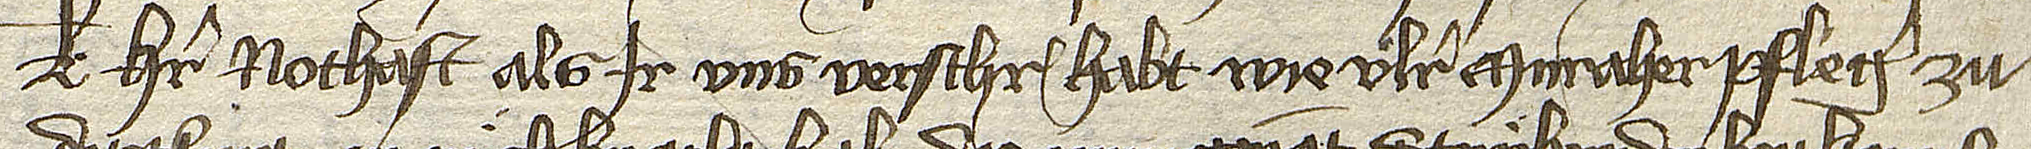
L* Hr* Nothaft als Ir vns verſchr* habt wie vlr* Muraher Pfleg* ʒu
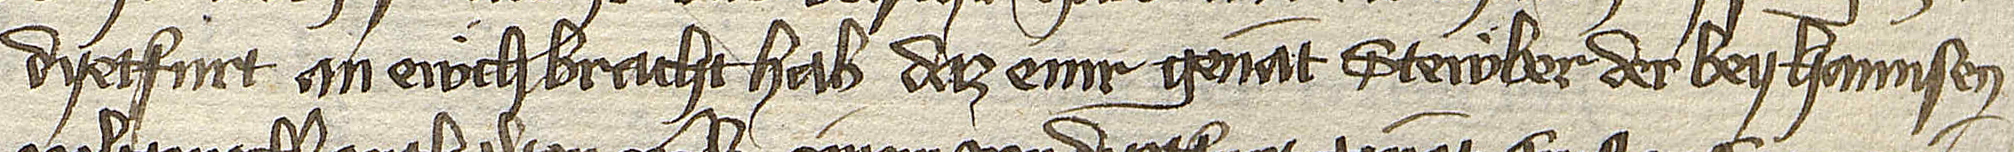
dyetfurt an eẅch bracht hab daʒ einr gena*t Steẅber der bey hannſen
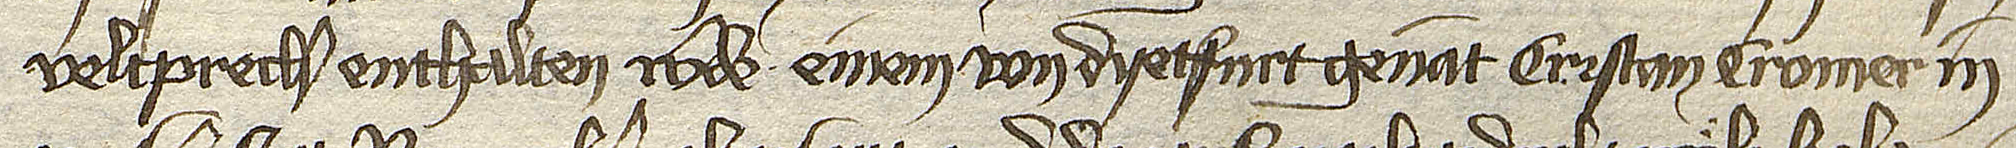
veltprech* enthalten w*de . einem von dyetfurt gena*t Criſtan Cromer in
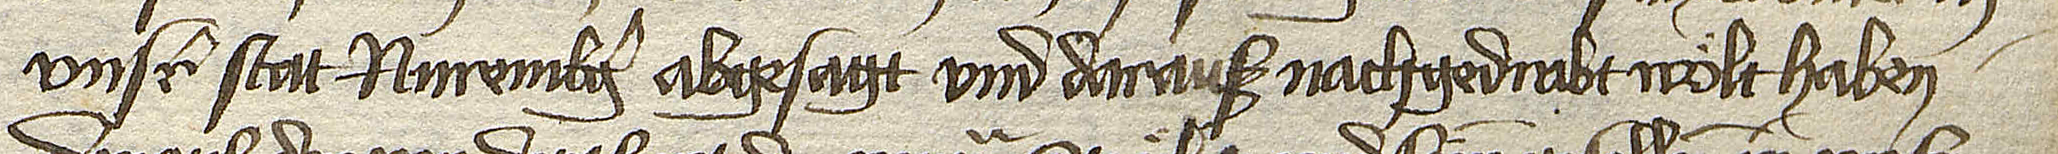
vnſr* ſtat Nuremb*g abgeſagt vnd darauſʒ nachgedrabt wölt haben /
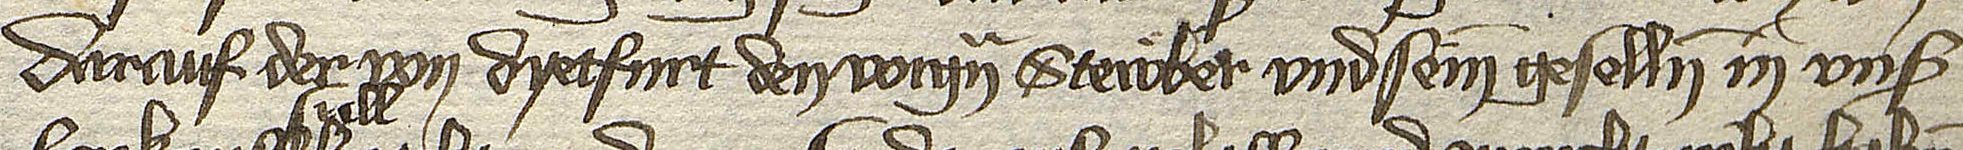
Darauf der von dyetfurt den vorgn* Steẅber vnd ſein* geſelln* in vnſ*
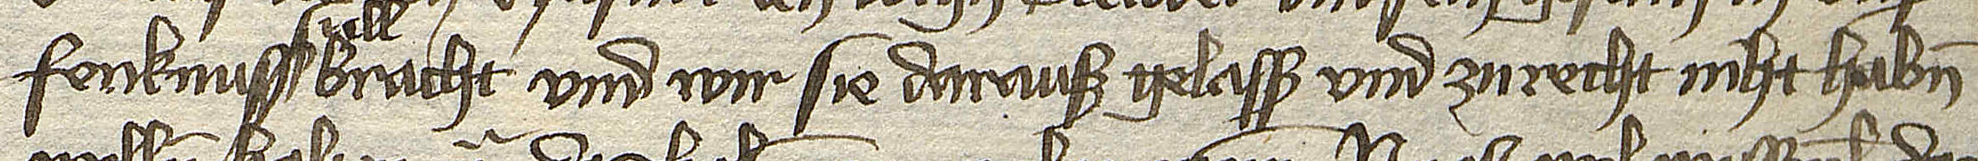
fenknuſſ bracht vnd wir ſie darauſʒ gelaſſ* vnd ʒu recht niht habn*
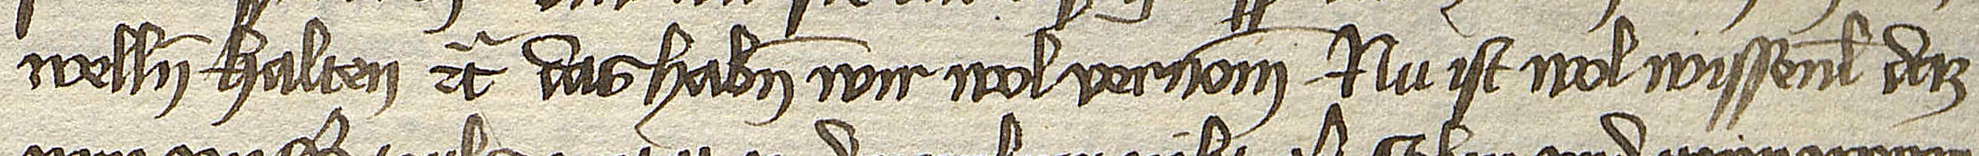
welln* halten ec* das habn* wir wol vernom* / Nu iſt wol wiſſenl* daʒ
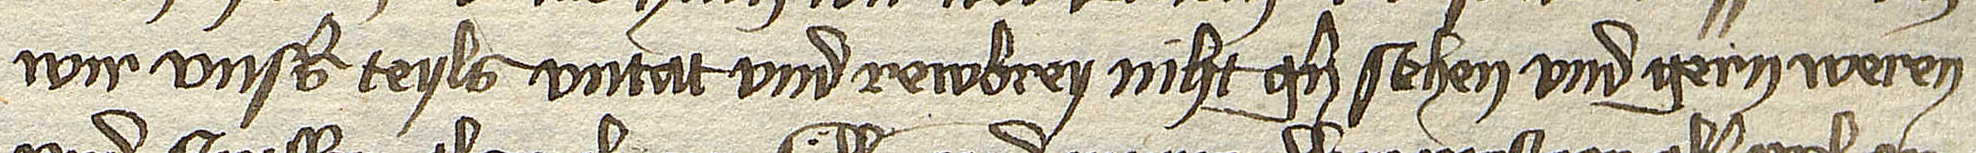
wir vnſ*s teyls vntat vnd rewbrey niht g*n ſehen vnd gern weren
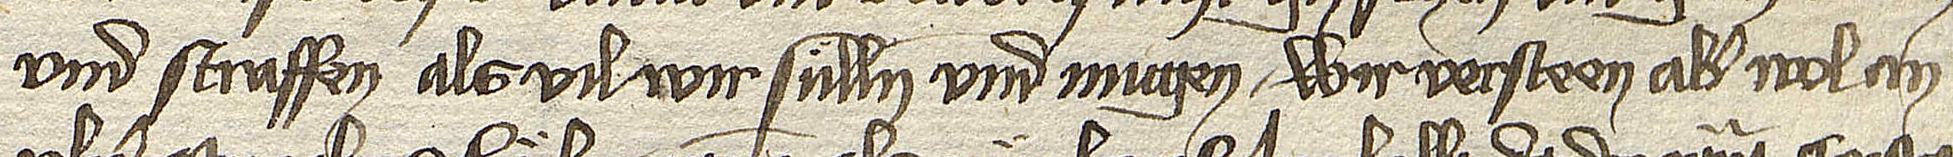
vnd ſtraffen als vil wir ſülln* vnd mugen / Wir verſteen ab* wol an
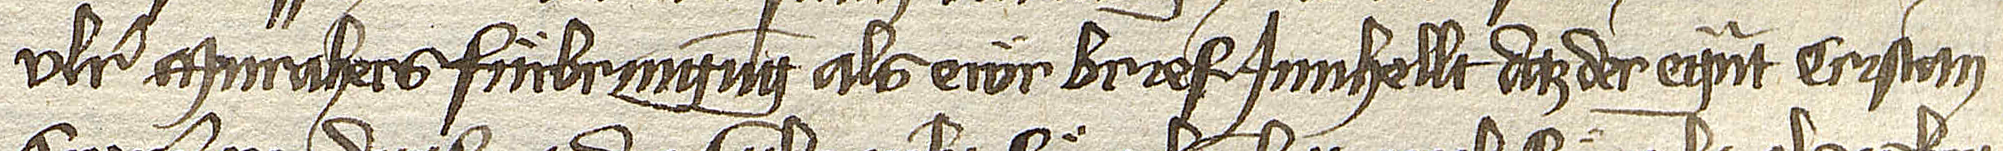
vlr* Murahers fürbringu*g als eẅr brief Innhellt daʒ der egnt* Criſtan
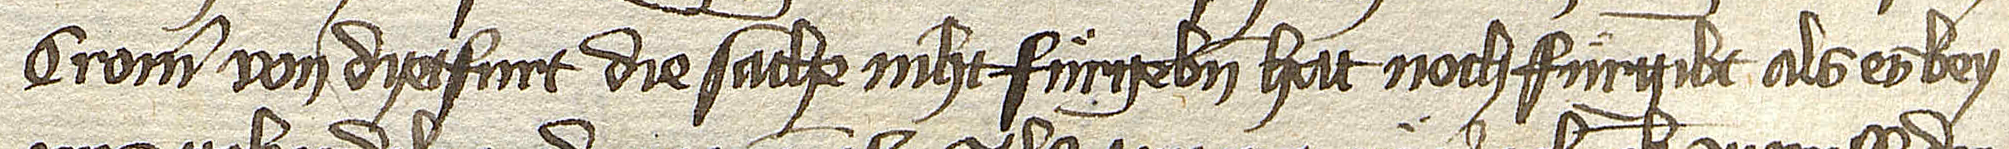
Crom* von dyetfurt die ſache niht fürgebn* hat noch fürgibt als es bey
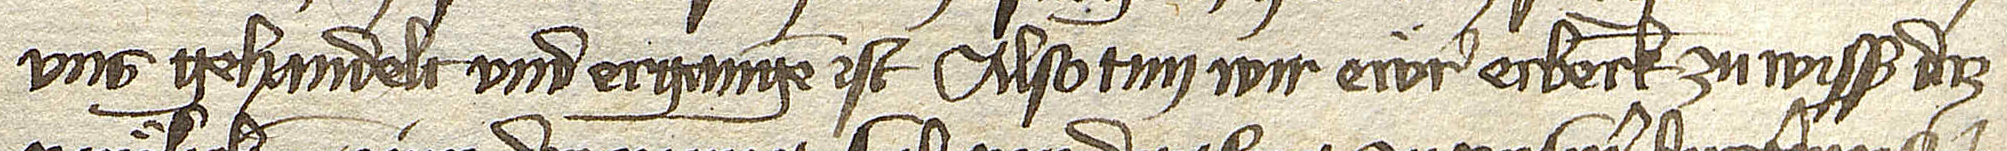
vns gehandelt vnd ergange* iſt Alſo tun wir eẅr* erberk* ʒu wiſſ* daʒ
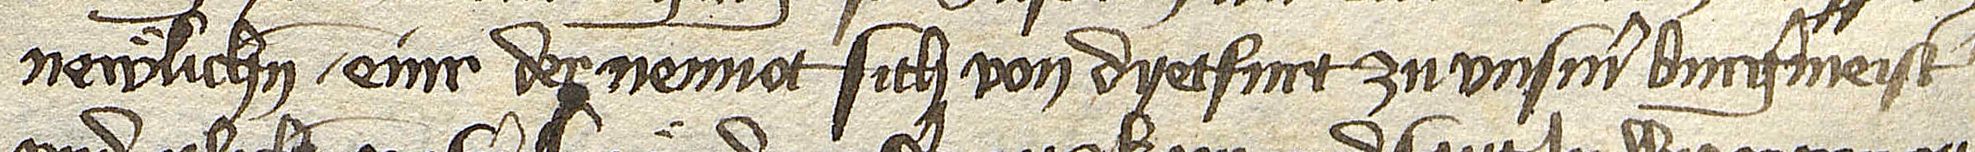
neẅlichn* / einr der nennet ſich von dyetfurt ʒu vnſm* burg*meiſt*
